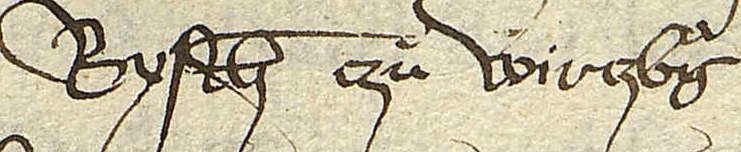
Byſch* cʒü wircʒb*g
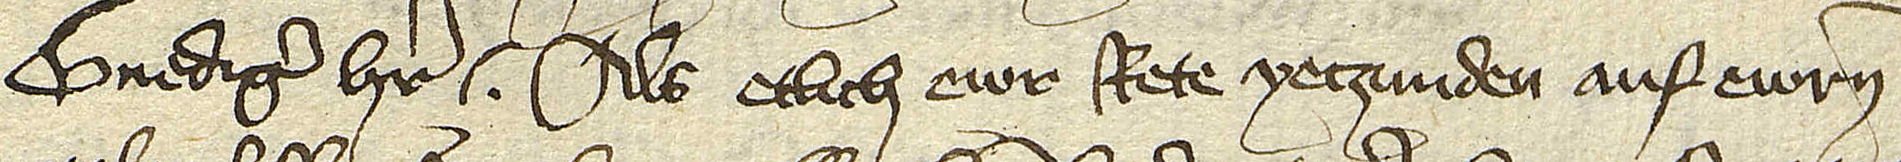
Gnedig* hr* / . Als etlich ewr Rete yecʒnden auf ewrn*
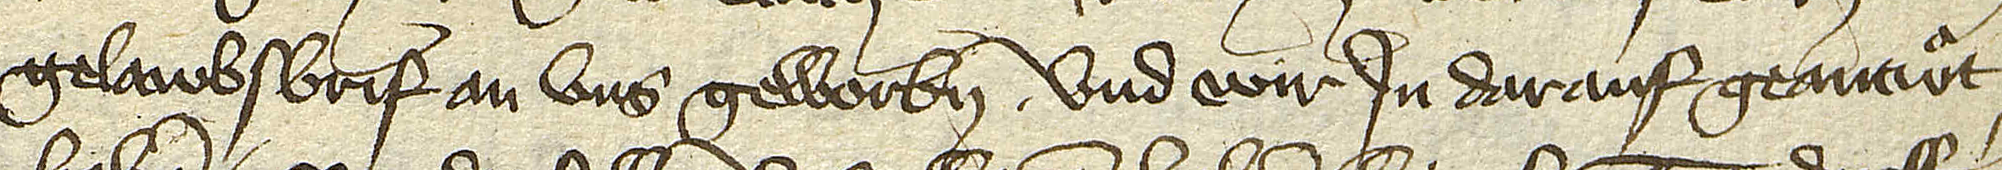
gelawbſbrif an vns geworbn* / vnd wir In darauf geantwt*
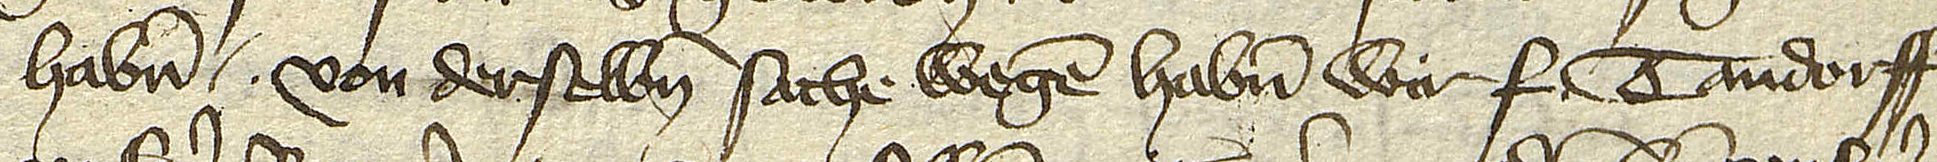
habn* / . von derſelbn* ſache wege* habn* wir f . Tandorff*
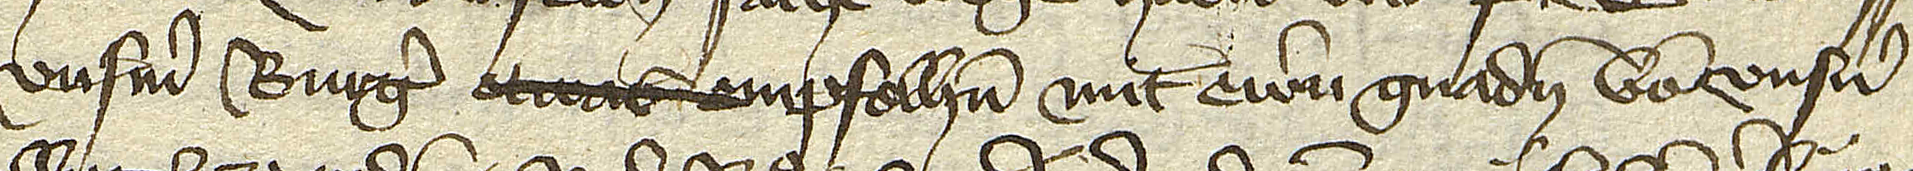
vnſm* Burg* etwas empfolhn* mit ewn* gnadn* vo* vnſn*
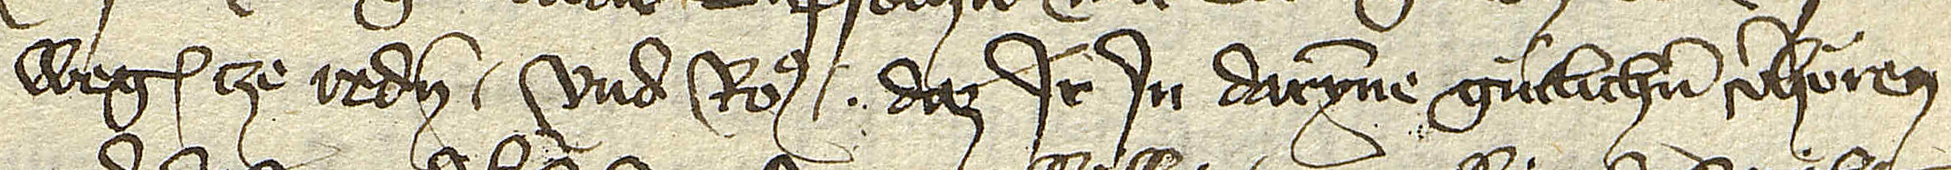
weg* cʒe redn* / vnd Ro* / . daʒ Ir In daryne* gütlichn* v*hören
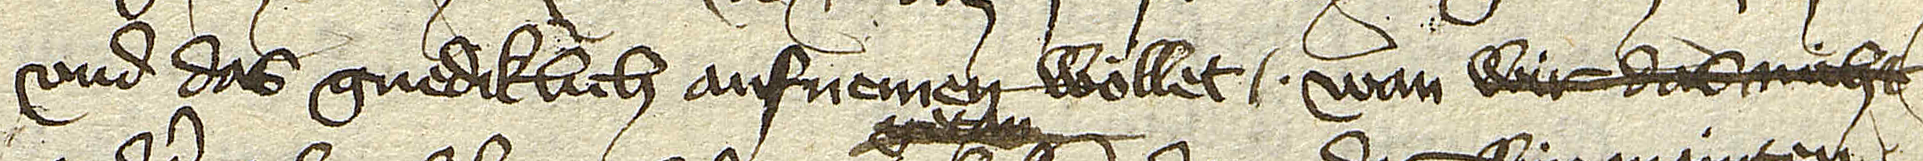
vnd das gnediklich aufnemen wöllet /. wan wir das nicht
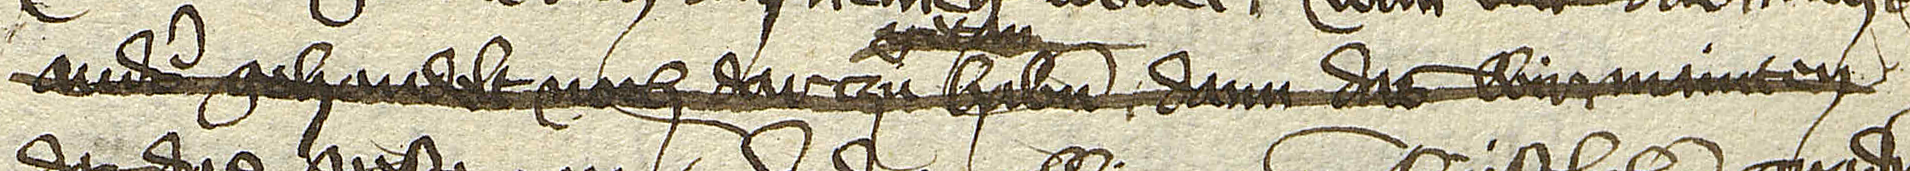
ands* gehandelt noch darcʒu habn* / dann das wir mainten
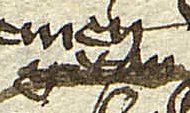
getan
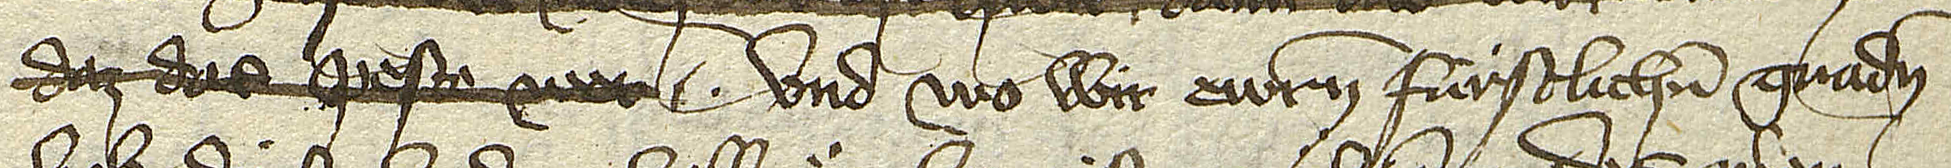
daʒ das peſte wer / . vnd wo wir ewrn* fürſtlichn* gnadn*
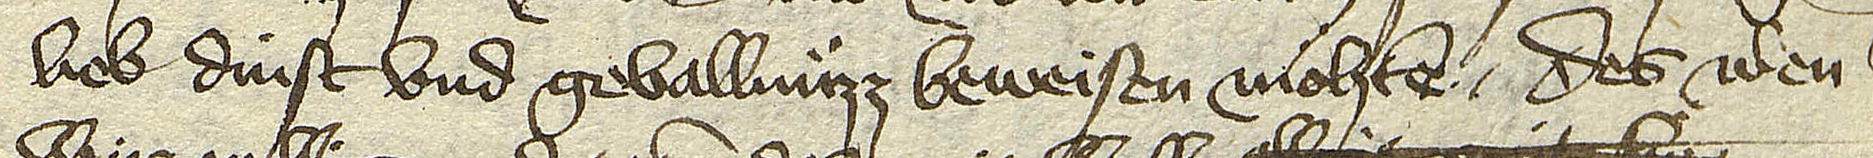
lieb dinſt vnd gevallnüʒʒ beweiſen möhte* / Das w*en
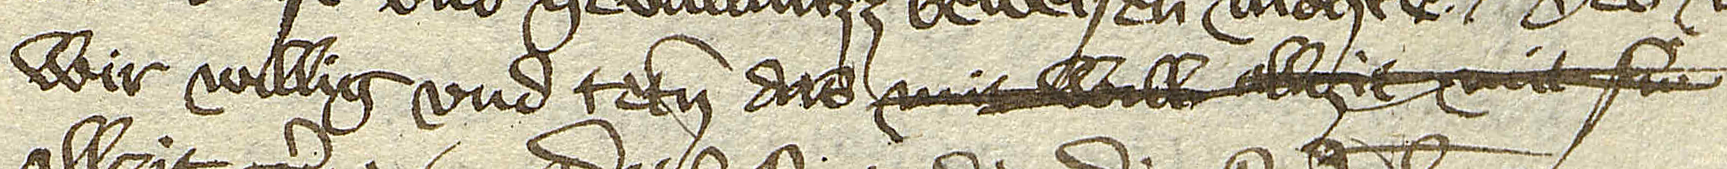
wir willig vnd tetn* das mit will allcʒit mit ſün
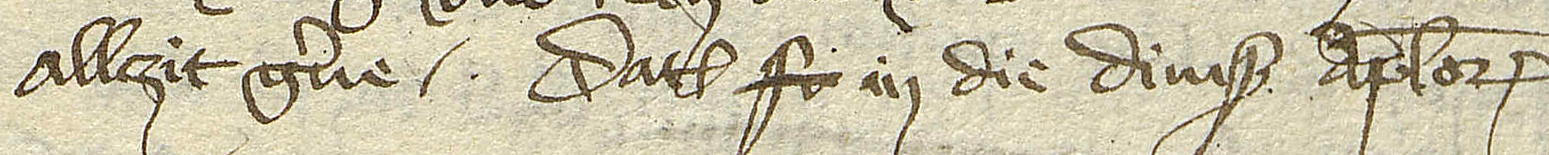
allcʒit g*ne / . Dat* fi in die diuiſ* Aplo*
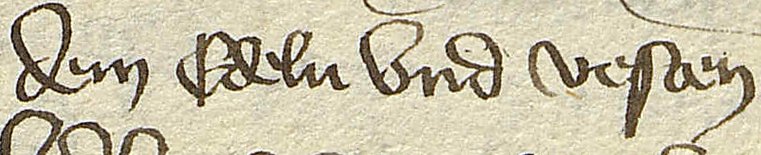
dem Edeln vnd veſten
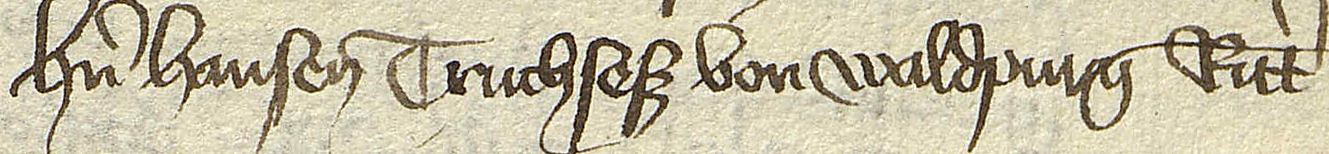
hn* hanſen Truchſeſʒ von waldpurg Ritt*
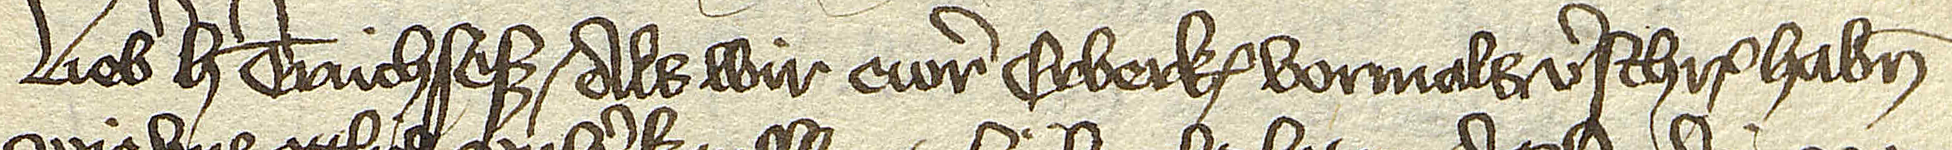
Lieb* h* Truchſeſʒ / Als wir ewr* Erberk* vormals v*ſchr* habn*
